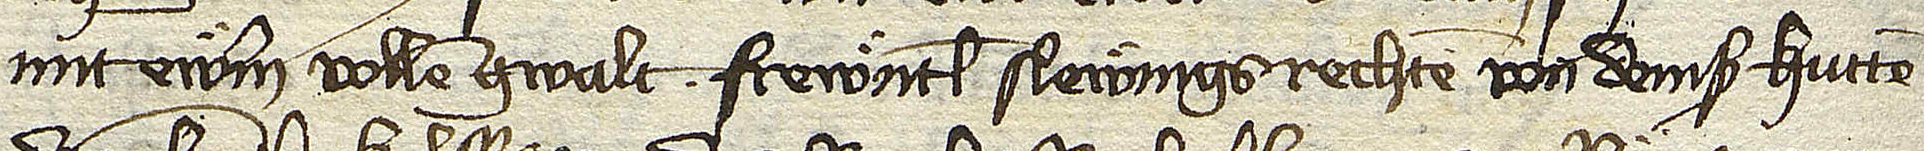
mit ew*m volle* gwalt . frewntl* ſlewnigs rechte* von demſ* hutte*
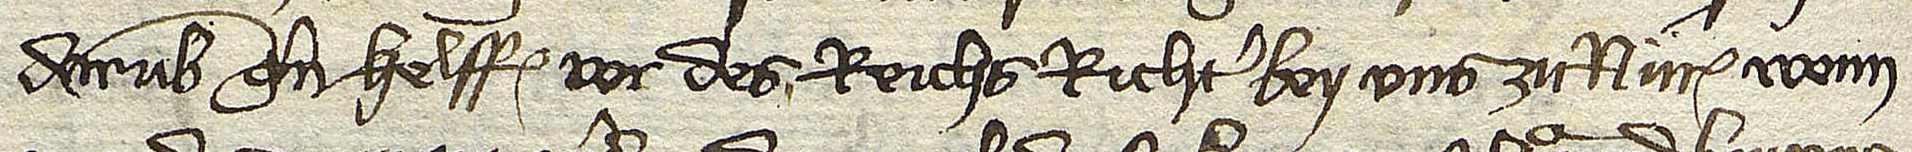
daru*b g*n helff* vor des Reichs Richt* bey vns ʒu Nür* wenn
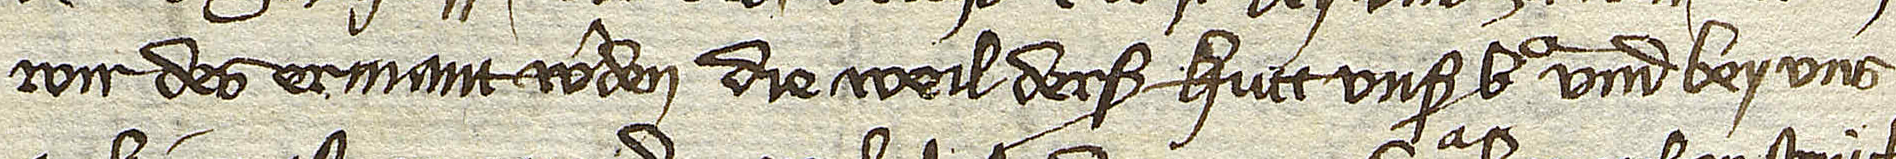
wir des ermant w*den die weil derſ* hutt vnſ* b* vnd bey vns
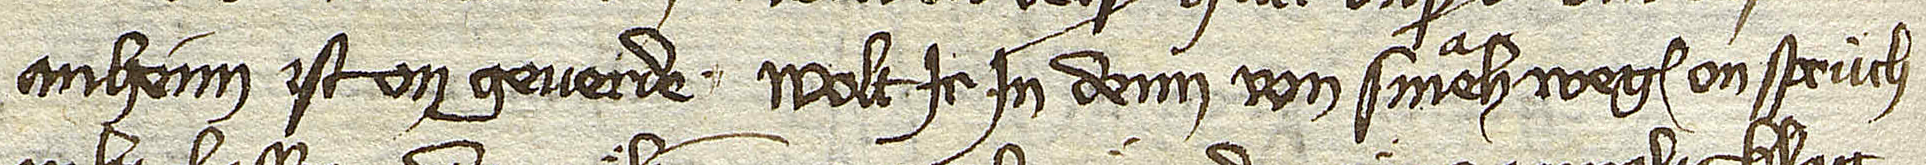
anheim iſt on geuerde . wolt Ir In denn von ſmëh weg* on ſprüch
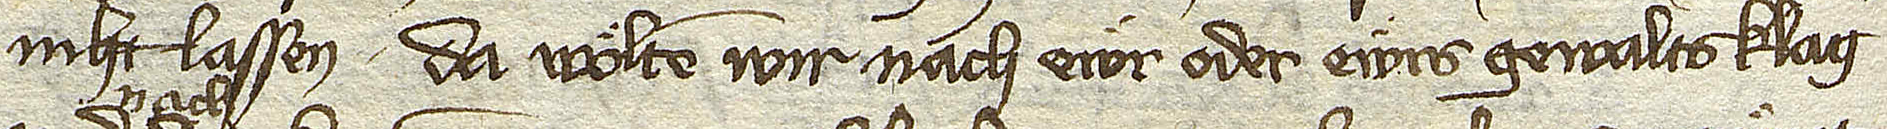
niht lassen / da wölte* wir nach ewr oder ewrs gewalts klag
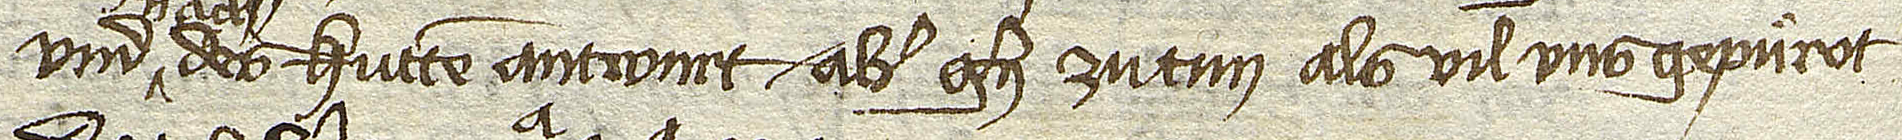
vnd des hutte* antwurt / ab* g*n ʒu tun als vil vns gepürot
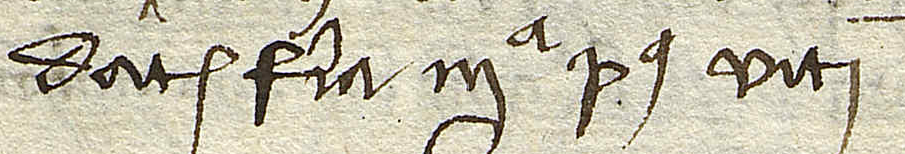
Dat* fia* iii* p* viti
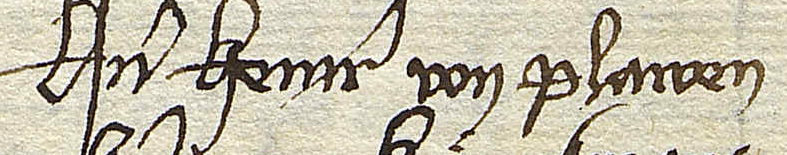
H*n Heinr* von Plawen
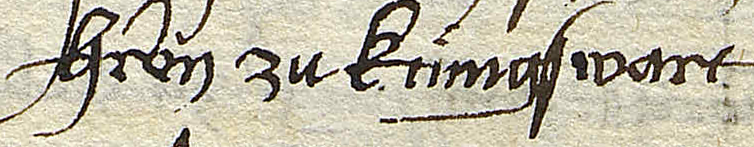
h*ren ʒu küngſwart
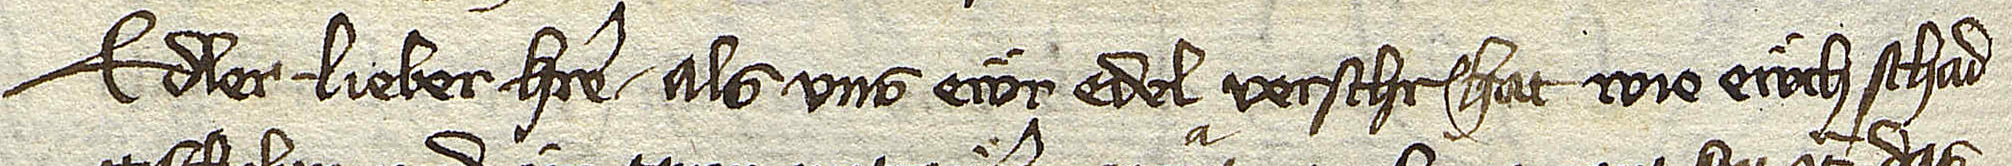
Edler lieber h*re / als vns ewr edel verſchr* hat wie ewch ſchad
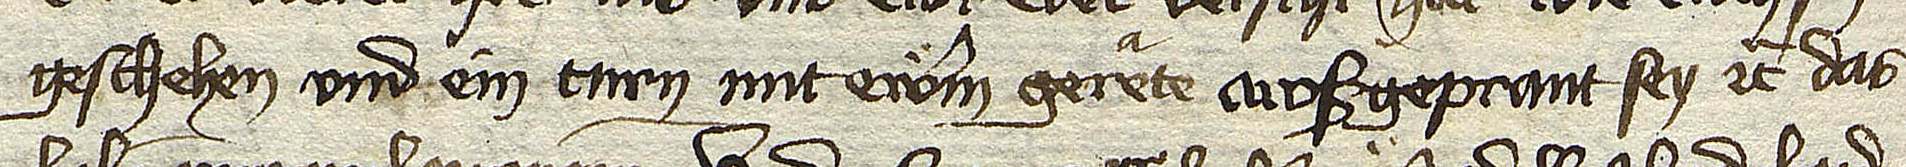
geſchehen vnd ein turn mit ew*m gerëte awſʒgeprant ſey ec* das
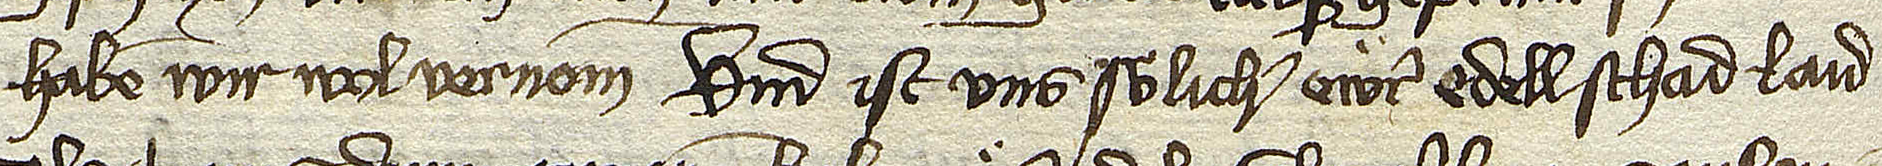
habe* wir wol vernom* Vnd iſt vns ſölich* ew*r edell ſchad laid
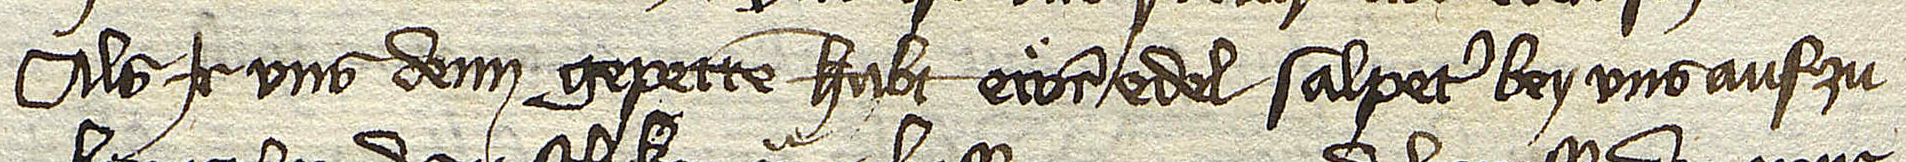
Als Ir vns denn gepette* habt ew*r edel ſalpet* bey vns aufʒu =
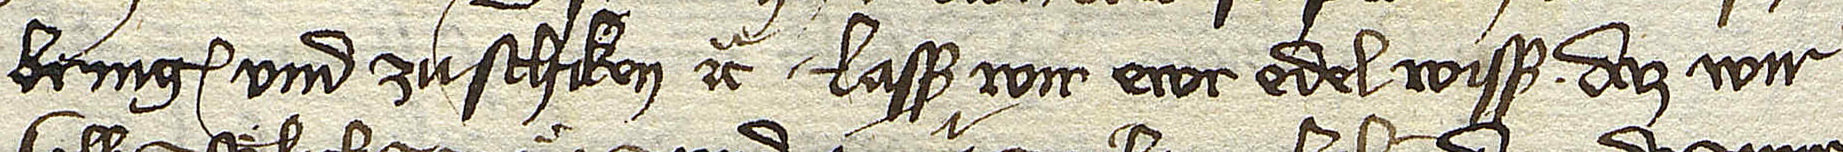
bring* vnd ʒu ſchiken ec* / laſſ* wir ewr edel wiſſ* . daʒ wir
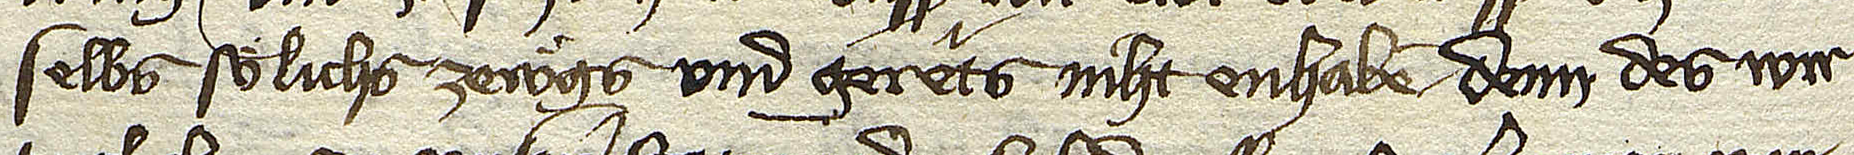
ſelbs ſölichs ʒewgs vnd gerëts niht enhabe* / denn des wir
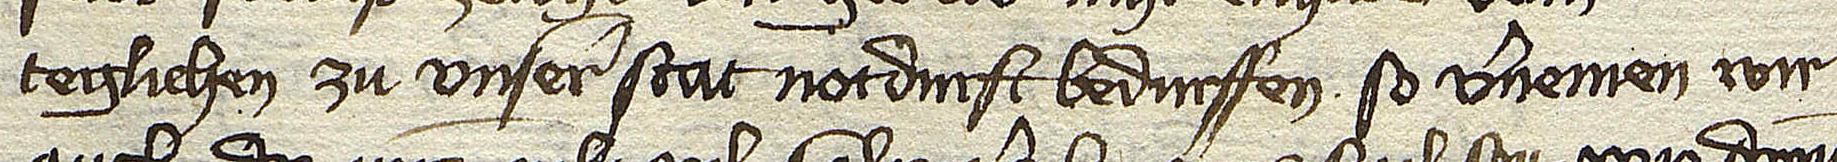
teglichen ʒu vnſer* ſtat notdurft bedurffen . ſo v*nemen wir
